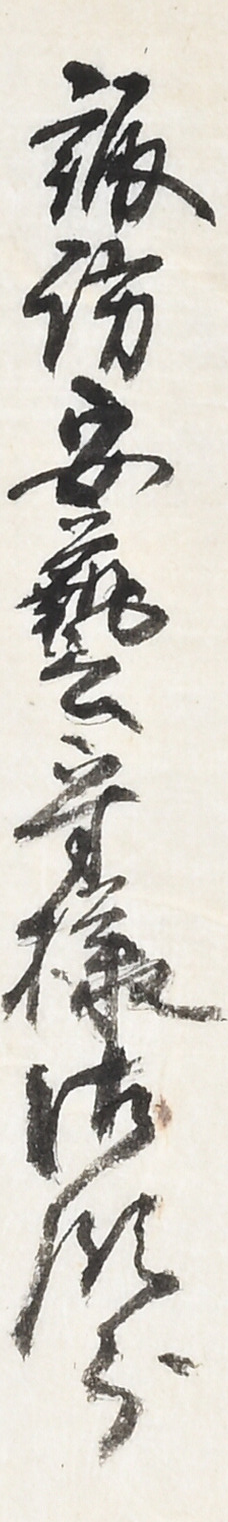諏訪安芸守様御領分
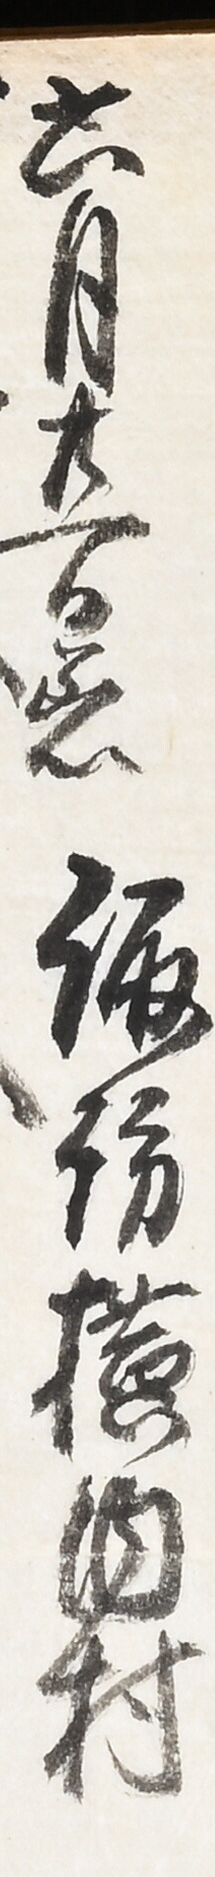六月廿一日着諏訪横内村
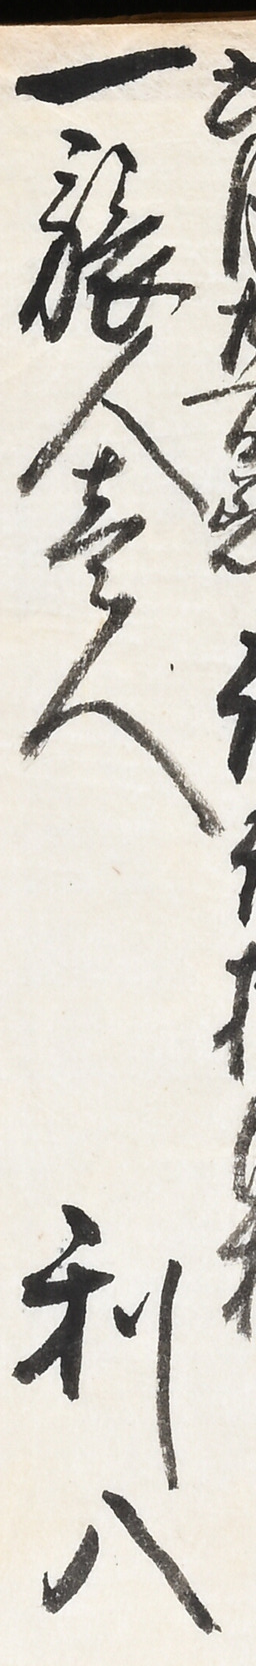一旅人壱人利八
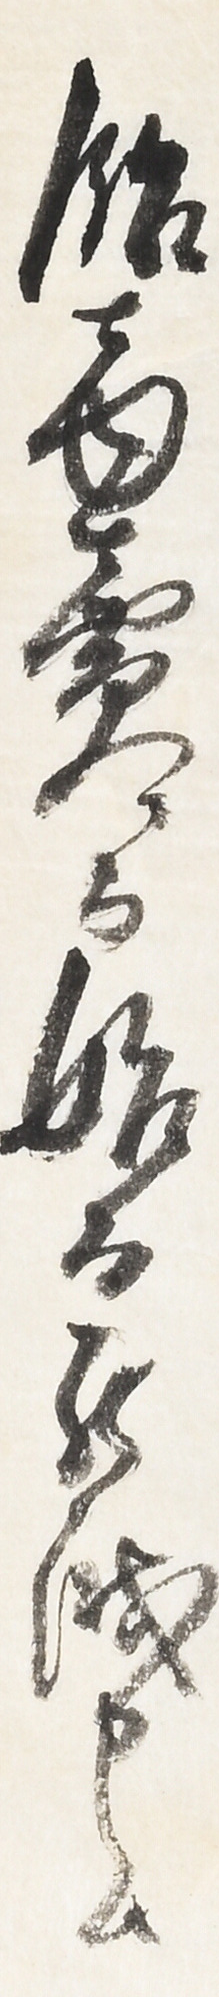飴商売ニ而始而罷越申候
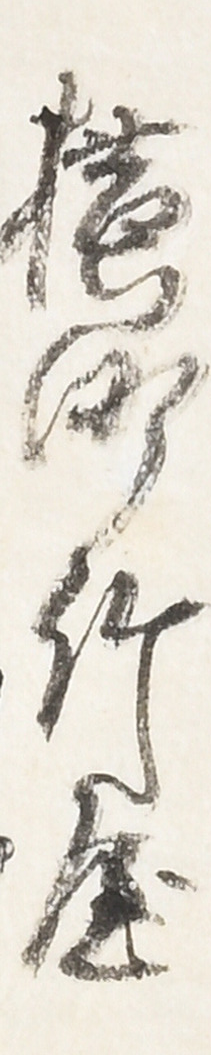横町竹屋
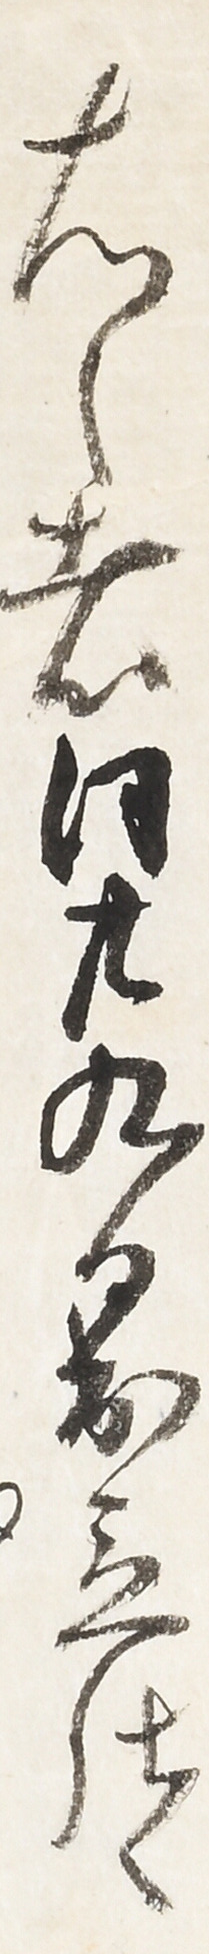右之者同廿九日出立仕候
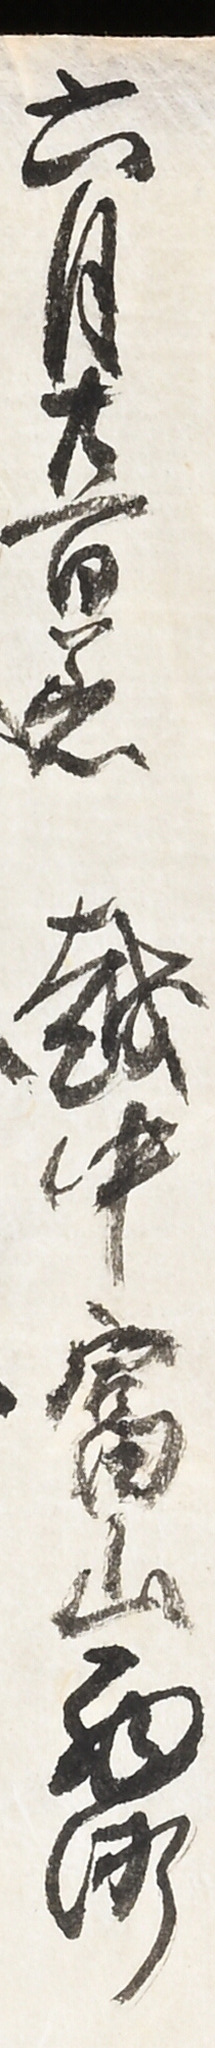六月廿一日着越中富山西町
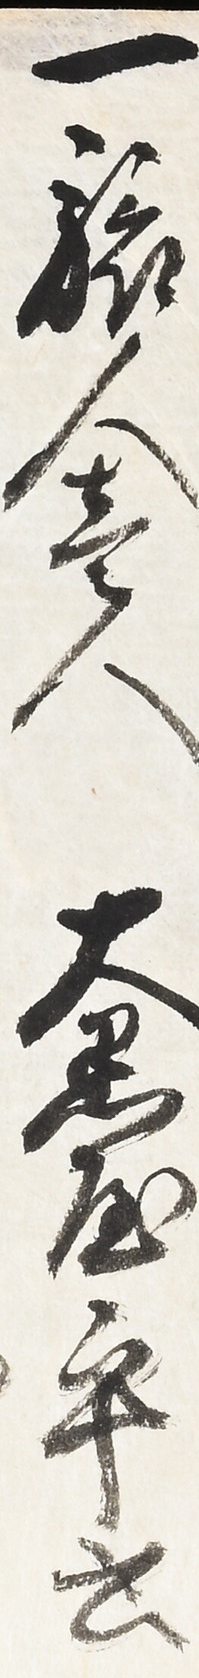一旅人壱人大黒屋平六
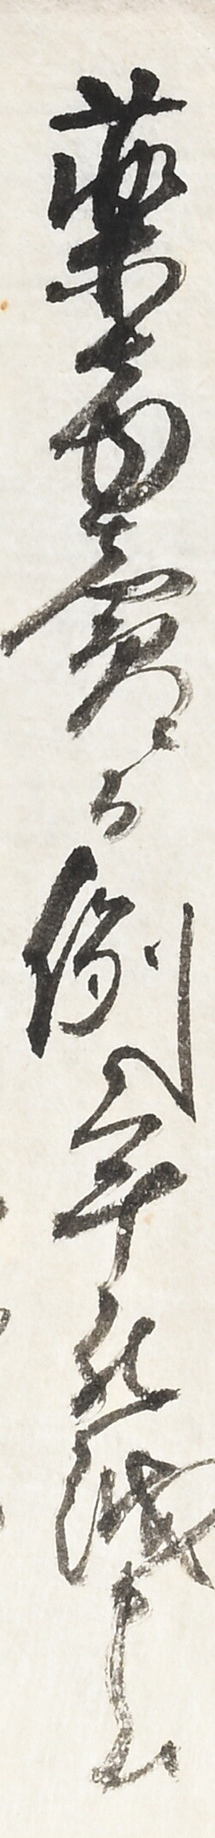薬商売ニ而例年罷越申候
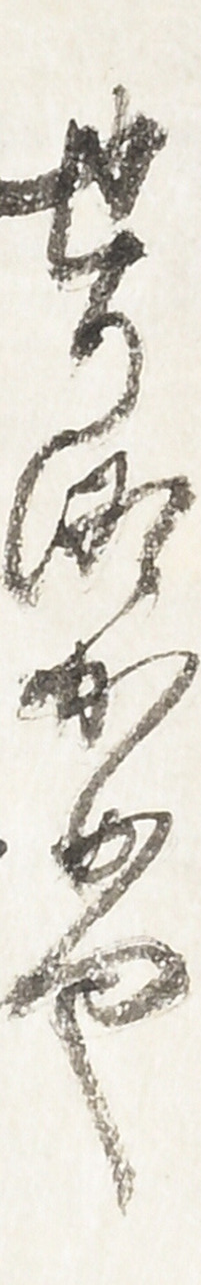せり町かかや
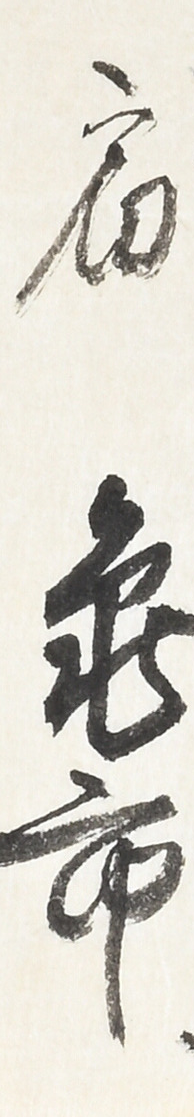宿亀市・
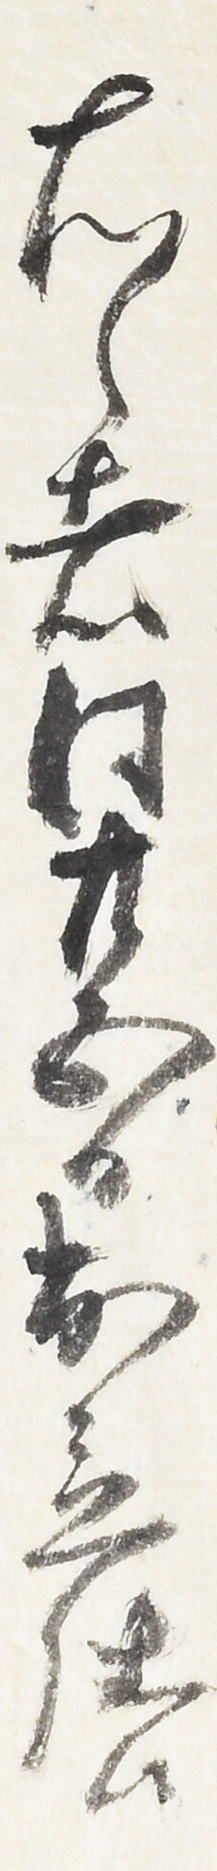右之者同廿四日出立仕候

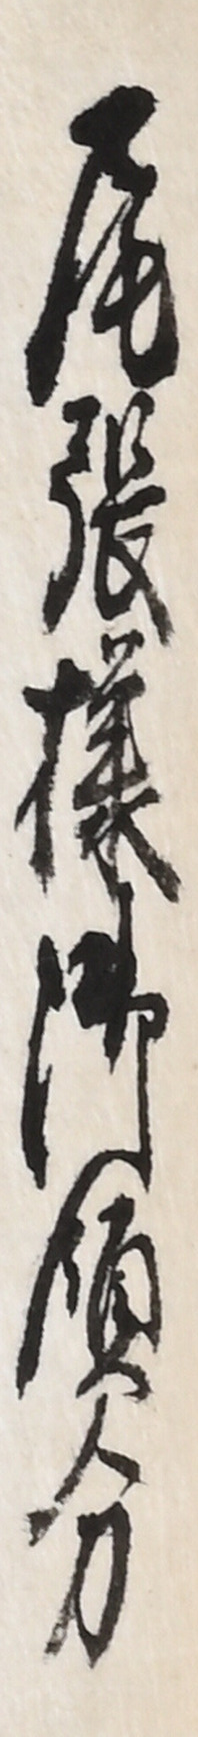尾張様御領分
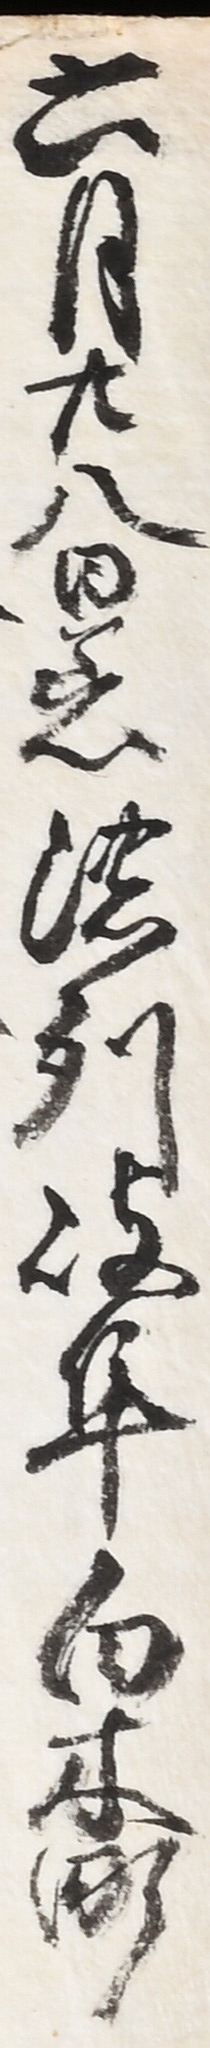六月廿鉢日着濃州岐阜白木町
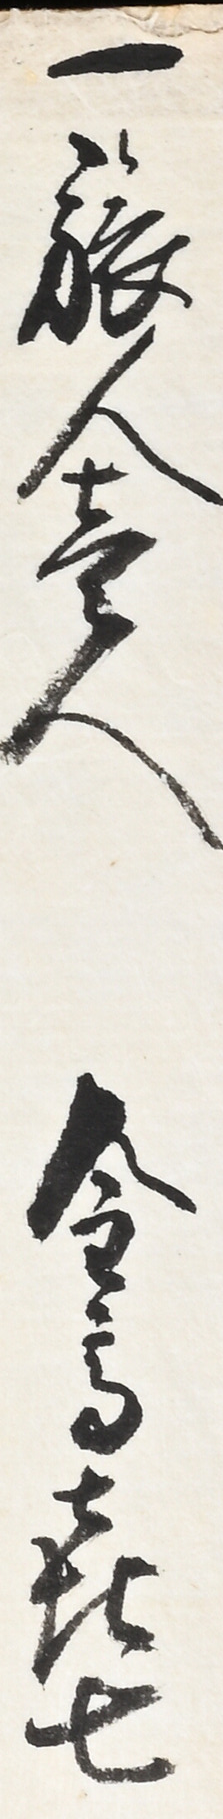一旅人壱人金高喜七
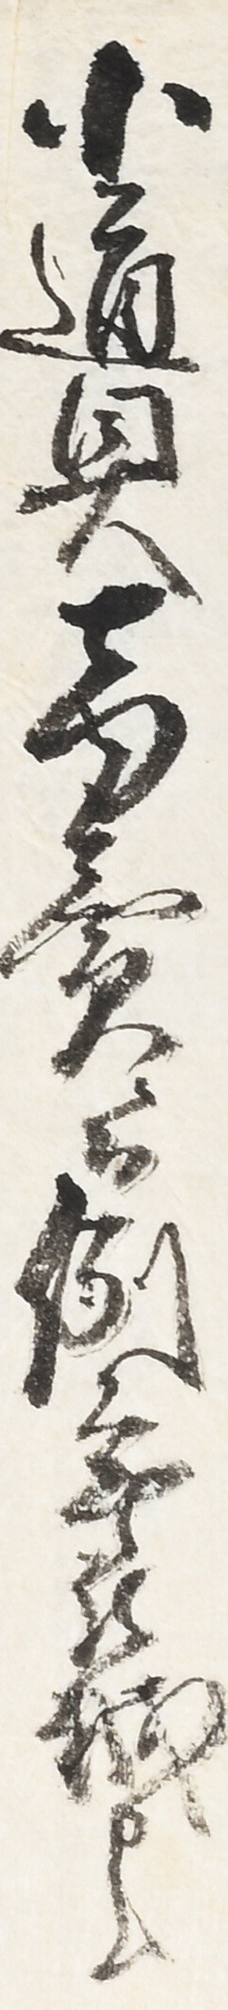小道具商売ニ而例年罷越申候
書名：旅人泊控帳
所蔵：伊那市立高遠町図書館・合同会社AMANE
